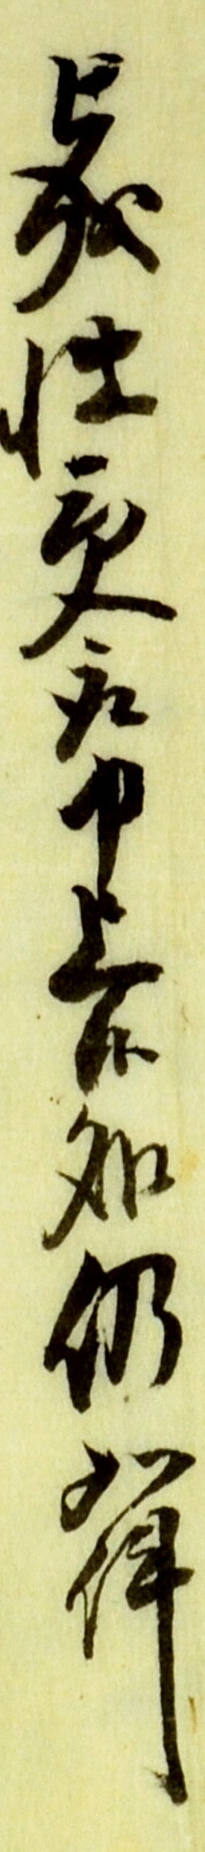被成仕受取申上候処仍如件
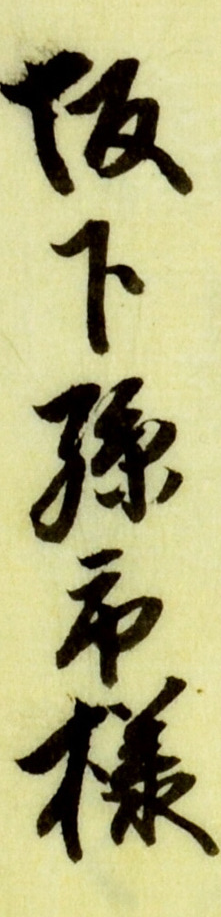坂下孫市様

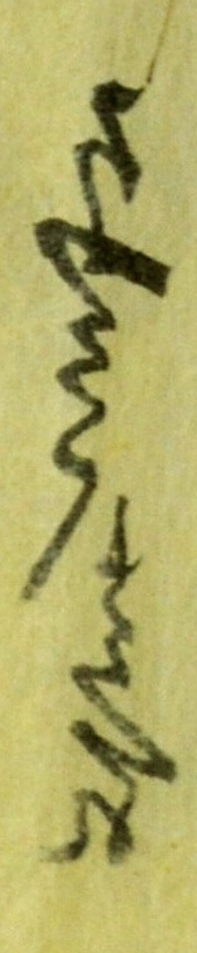十九日
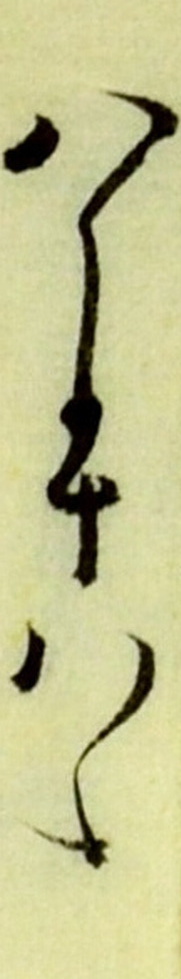八月十八日
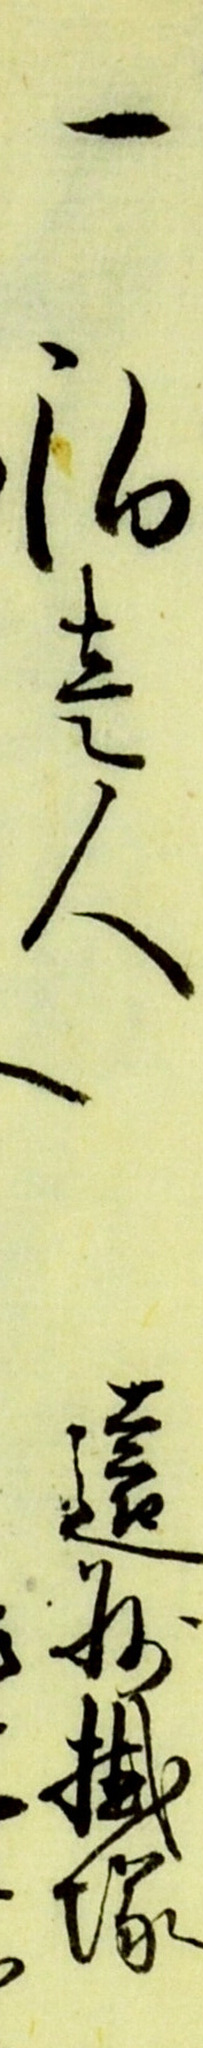一泊壱人遠州掛塚
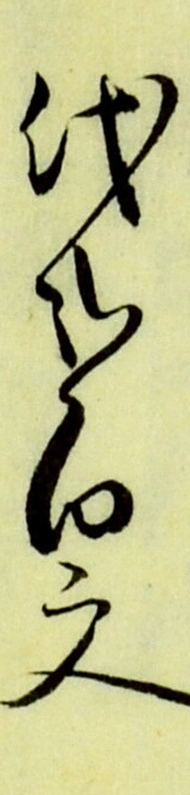代弐百文
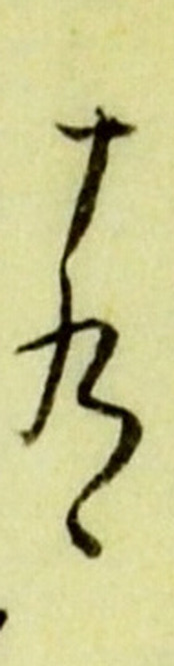十九日
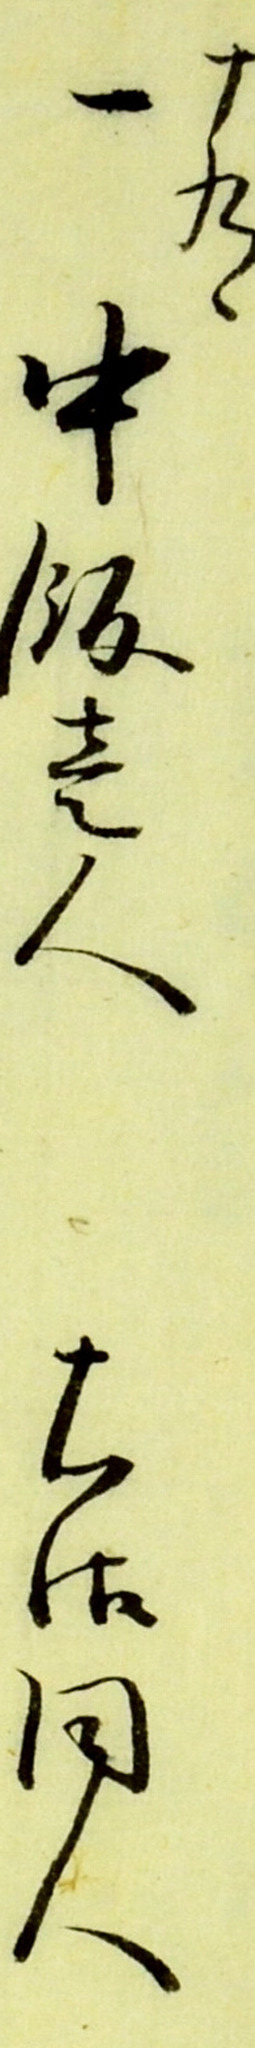一中飯壱人右御同人
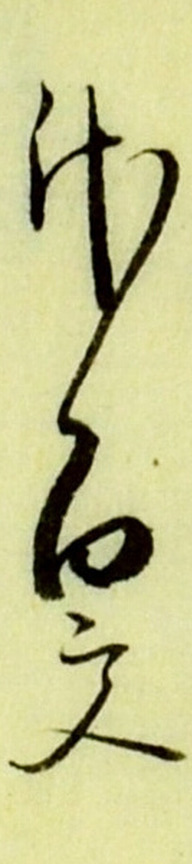代百文
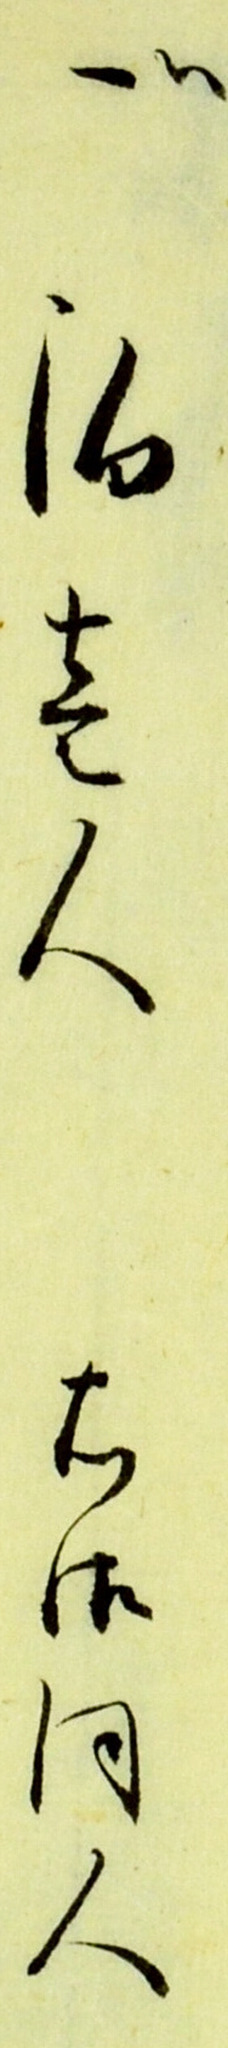一泊壱人右御同人
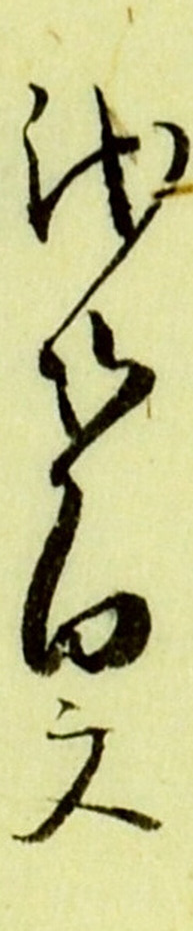代弐百文
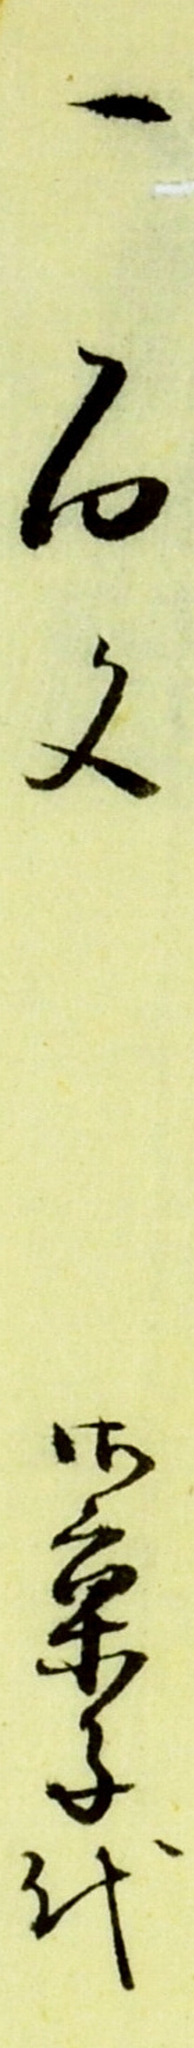一百文御菓子代
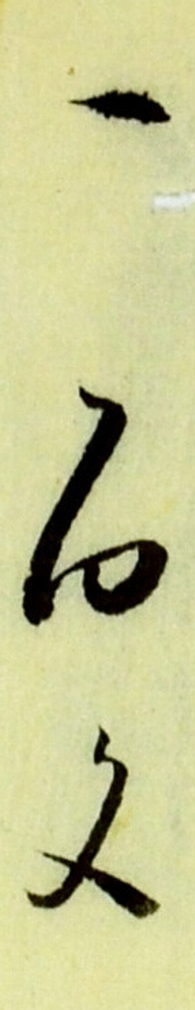代百文
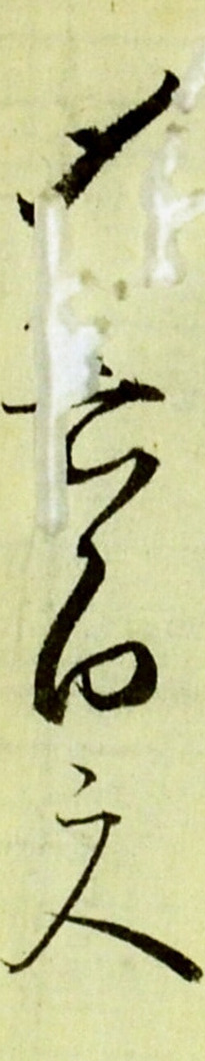〆六百文
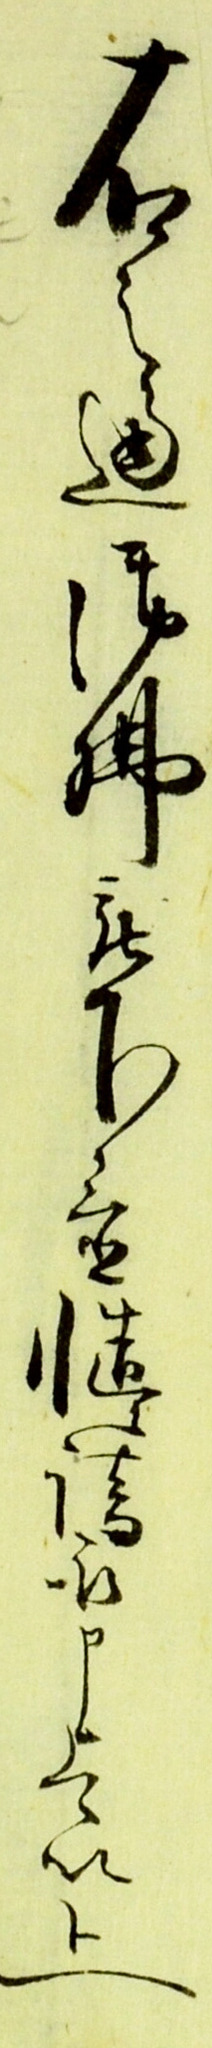右之通御払被下置慥ニ請取申上候以上
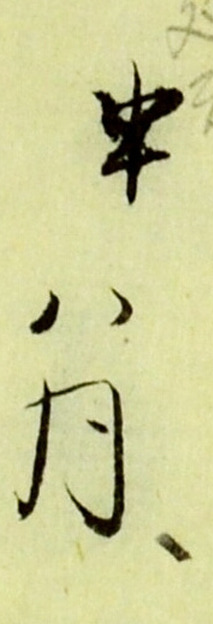申八月
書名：覚
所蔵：伊那市立高遠町図書館・合同会社AMANE
